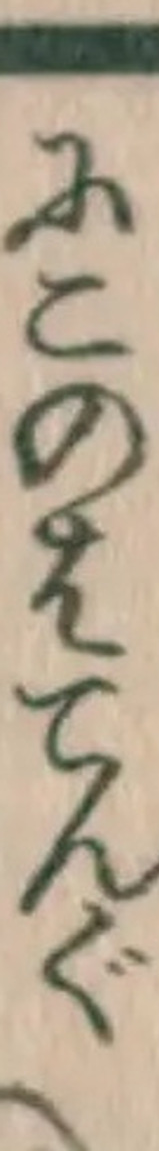にこのはてんぐ
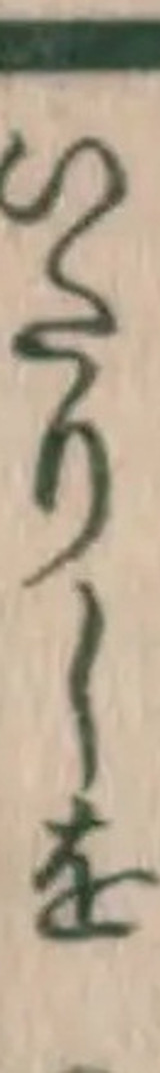いたりしを
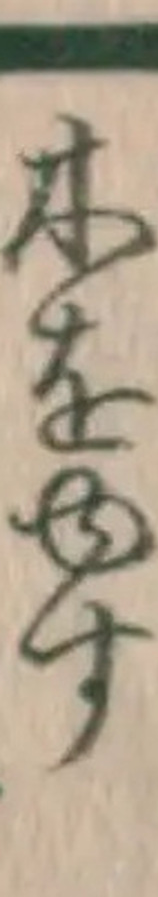木をゆす
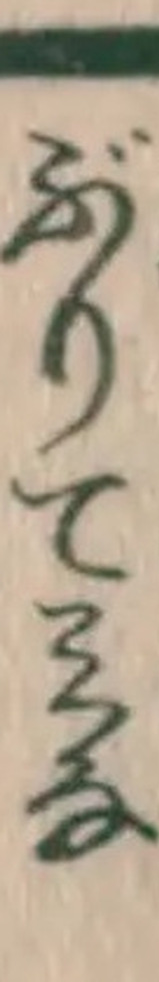ぶりてみな
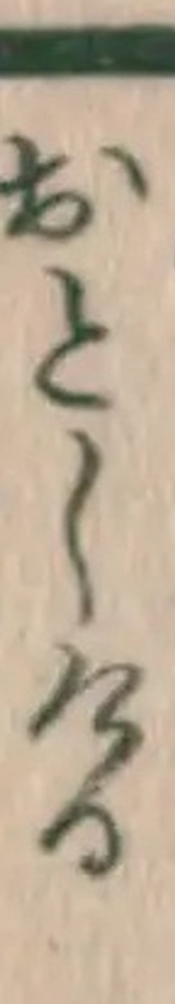おとしける
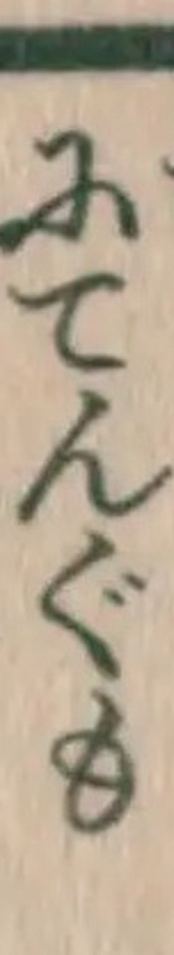にてんぐも
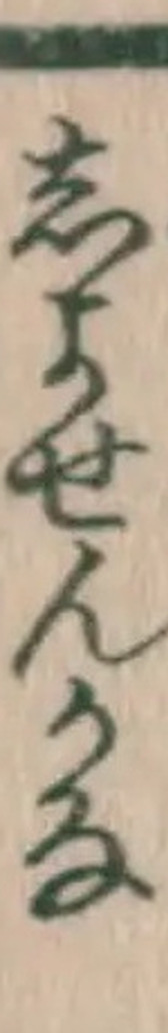しよせんかな
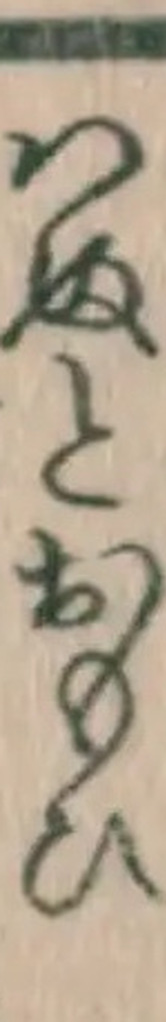はぬとおもひ
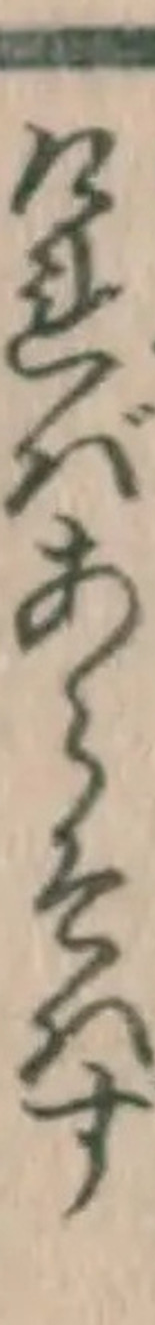きればあらそはず
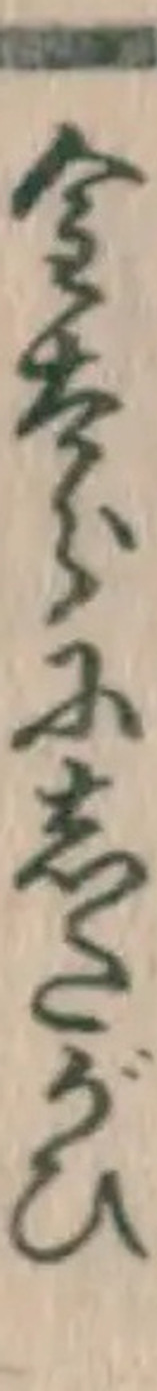金太郎にしたがひ
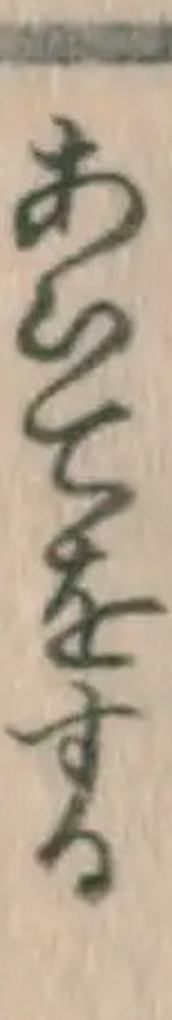あいてをする
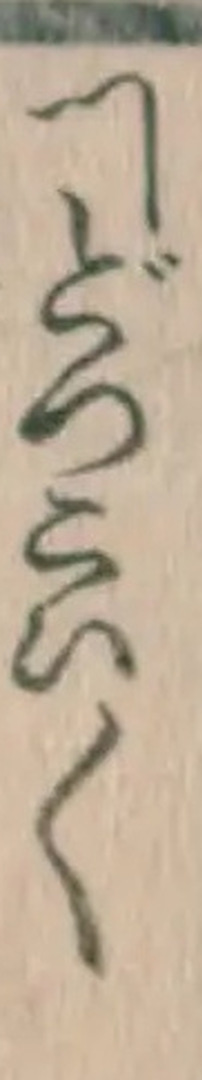〽どつこい〳〵
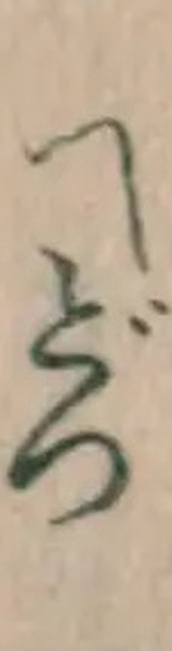〽どつ
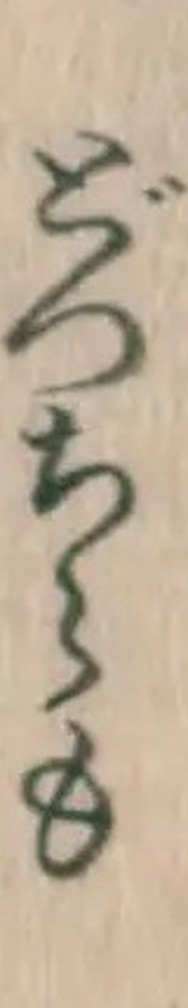どつちらも
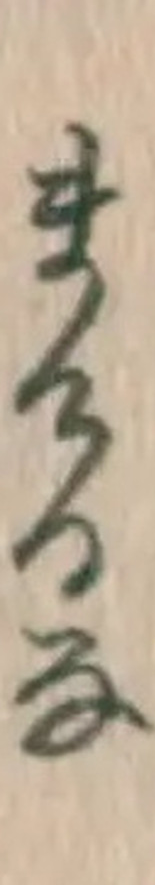まけるな
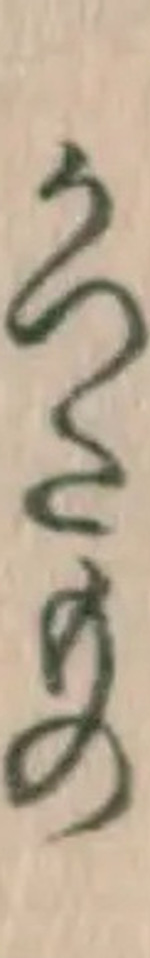かつたもの
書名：金太郎
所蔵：国立国会図書館 National Diet Library, JAPAN
